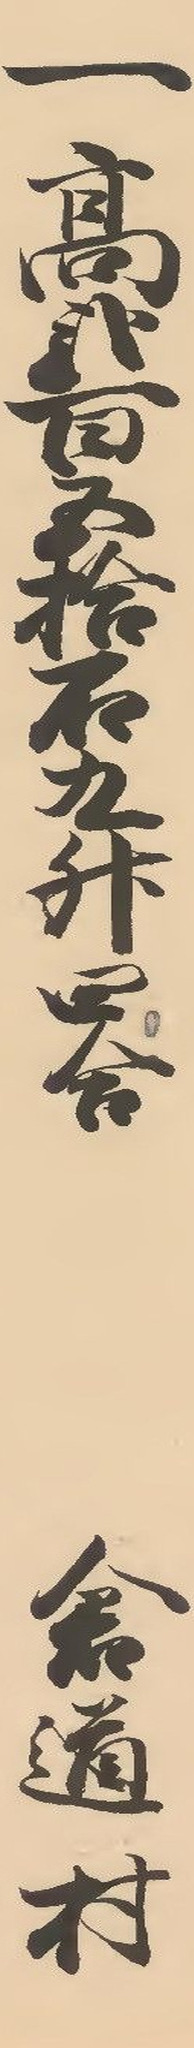一高弐百五拾石九升四合倉道村
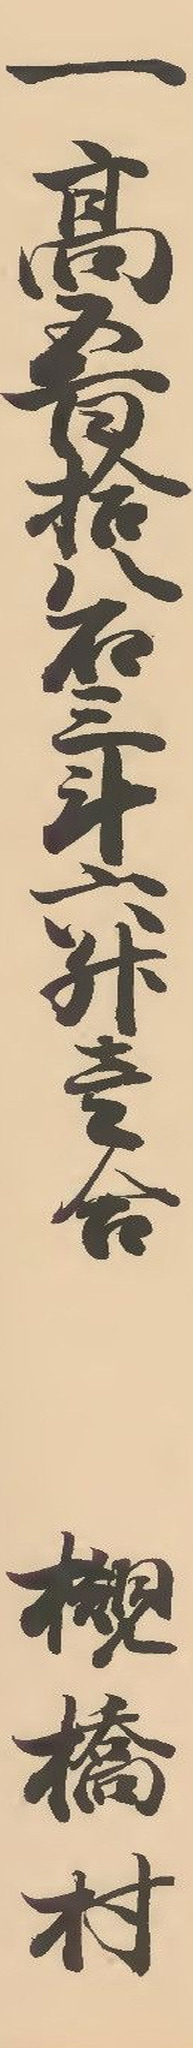一高五百拾八石三斗六升壱合槻橋村
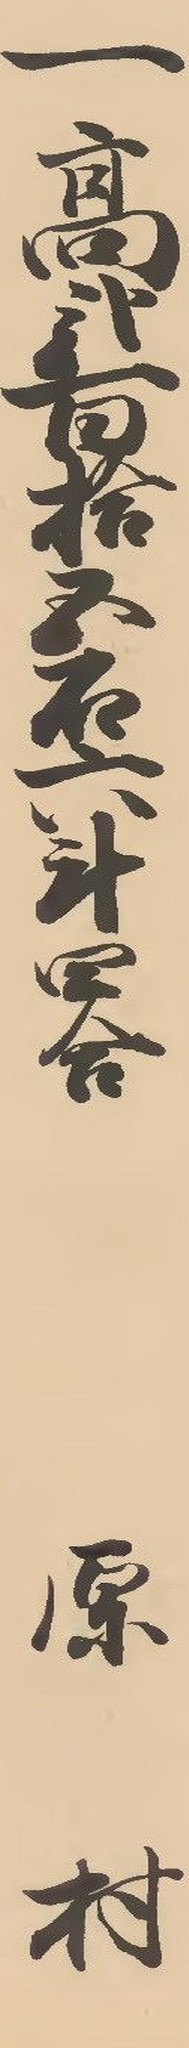一高弐百拾五石六斗四合原村
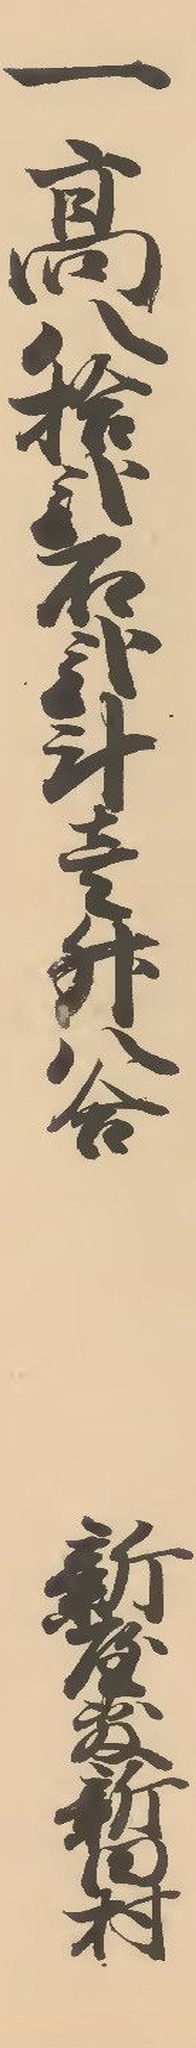一高八拾弐石弐斗壱升八合新屋敷新田村
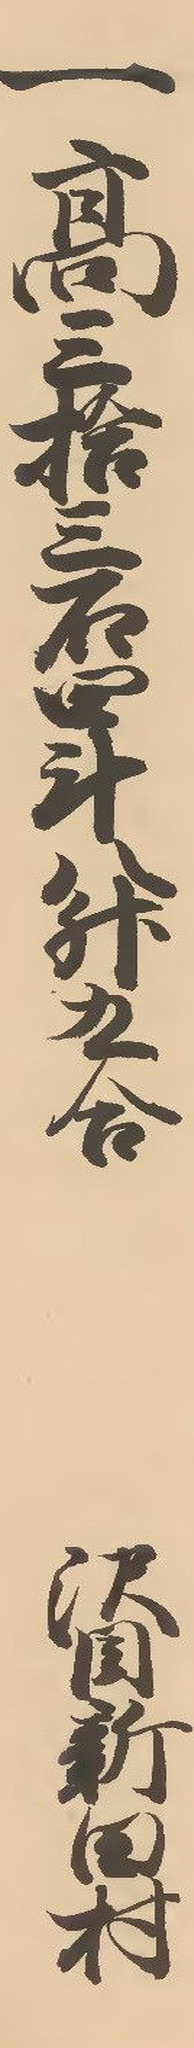一高三拾三石四斗八升九合沢目新田村
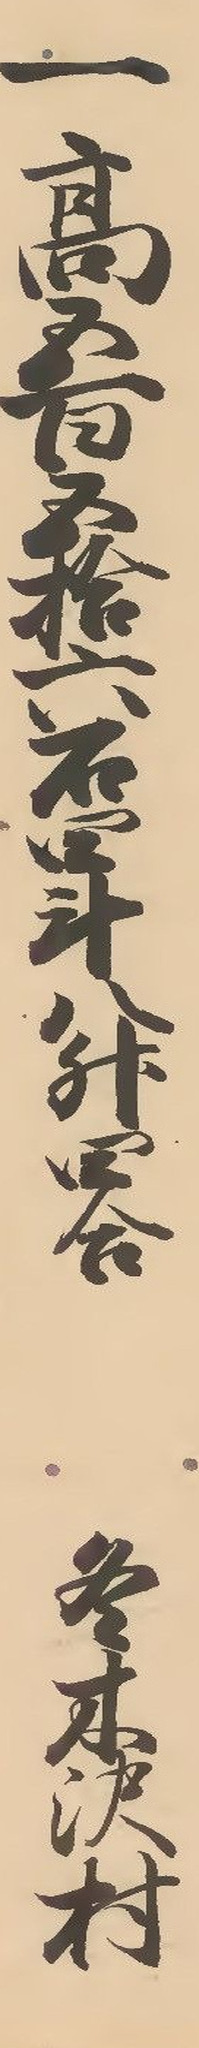一高五百五拾六石四斗八升四合冬木沢村

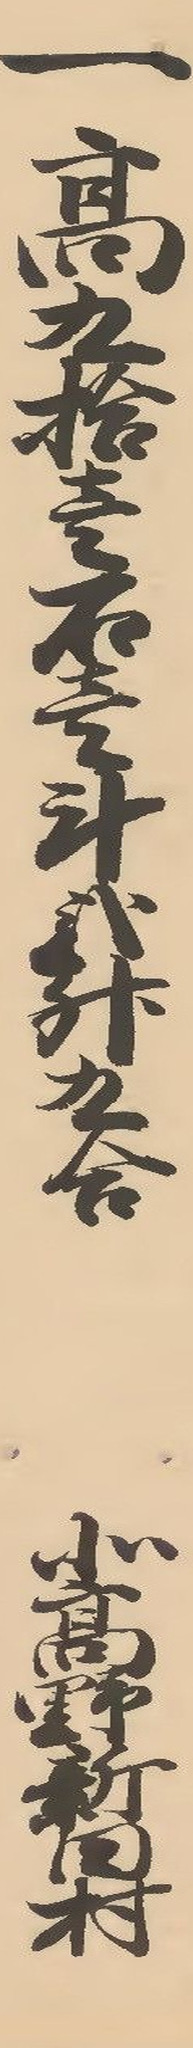一高九拾壱石壱斗弐升九合北高野新田村
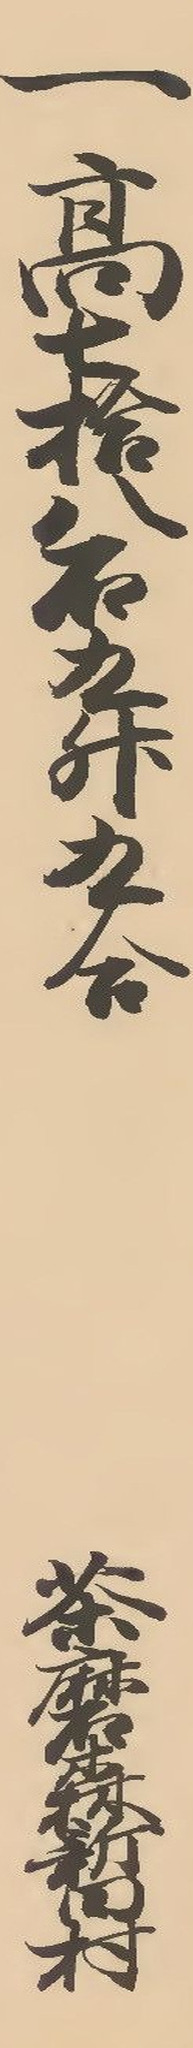一高七拾八石九升九合茶磨森新田村
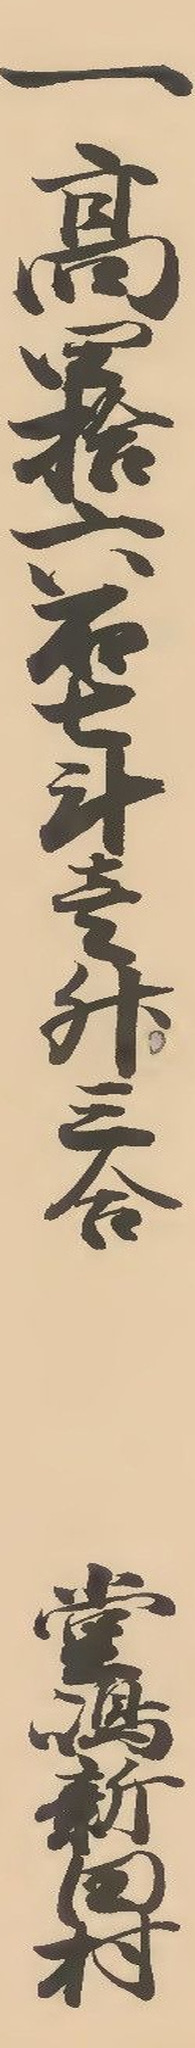一高四拾六石七斗壱升三合堂島新田村
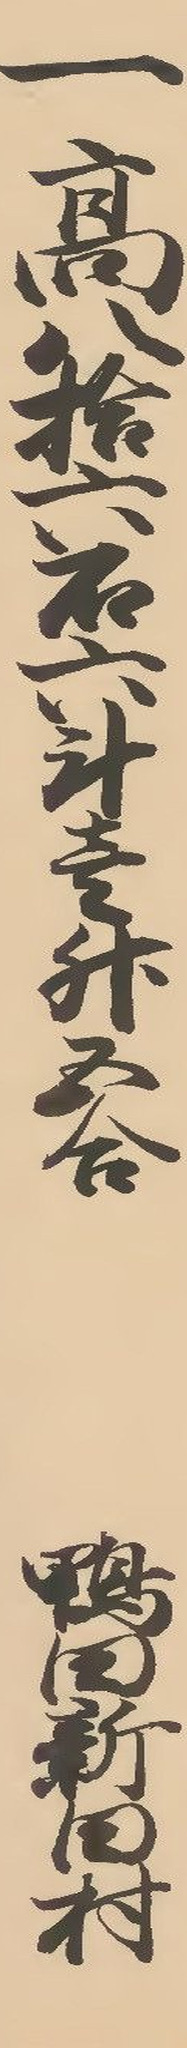一高八拾六石六斗壱升五合鴨田新田村
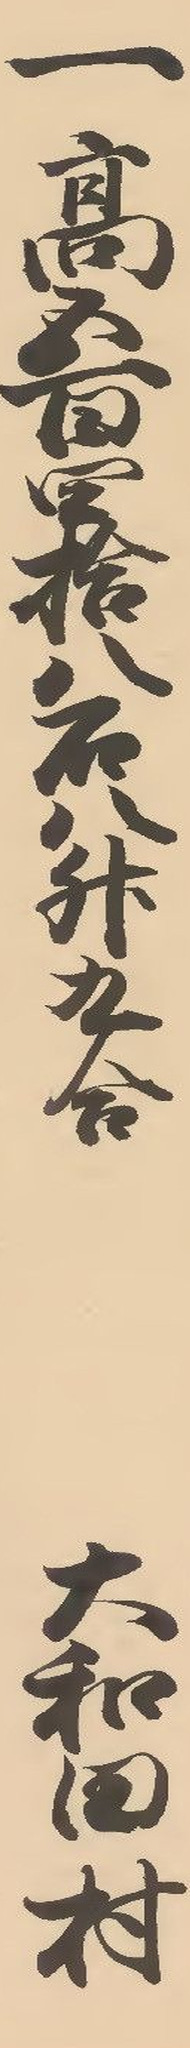一高五百四拾八石八升九合大和田村
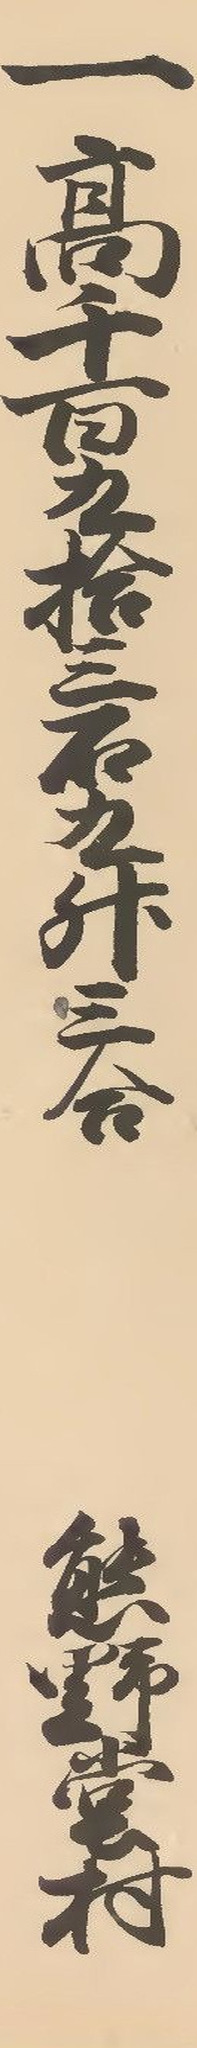一高千百九拾三石九升三合熊野堂村
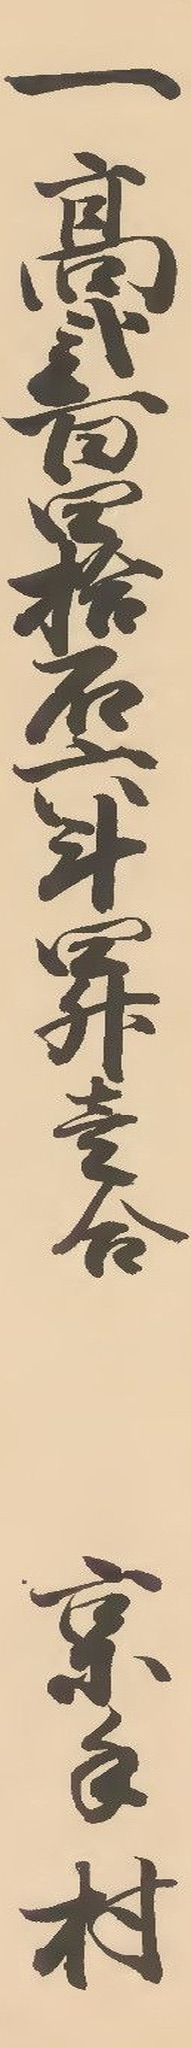一高弐百四拾石六斗四升壱合京手村
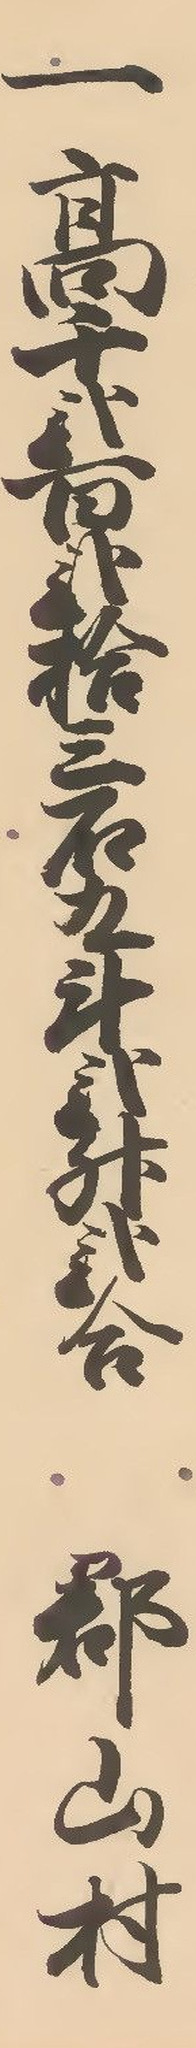一高千弐百弐拾三石九斗弐升弐合郡山村

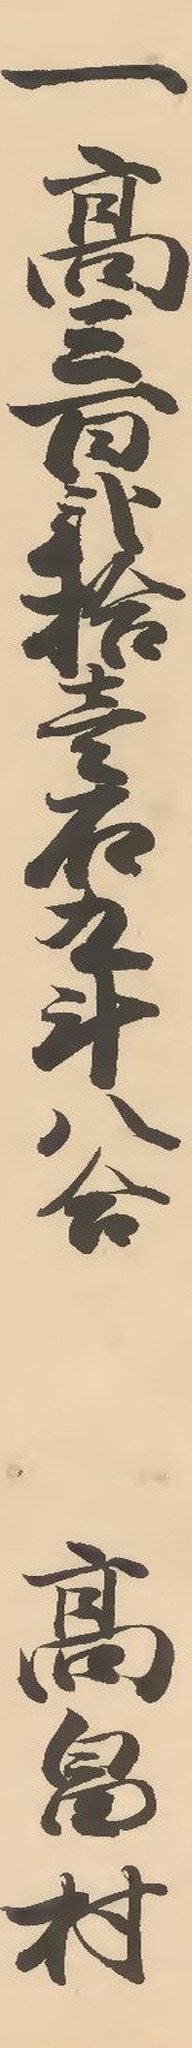一高三百弐拾壱石九斗八合高畠村
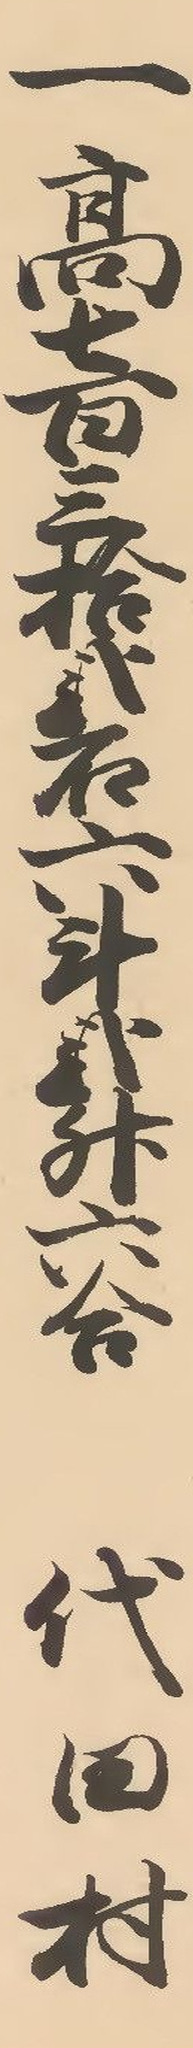一高七百三拾弐石六斗弐升六合代田村
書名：陸奥国郷帳　１
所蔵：国立公文書館 National Archives of Japan
